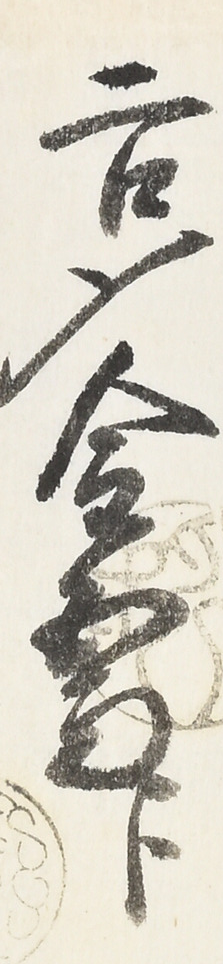二口〆金五両ト
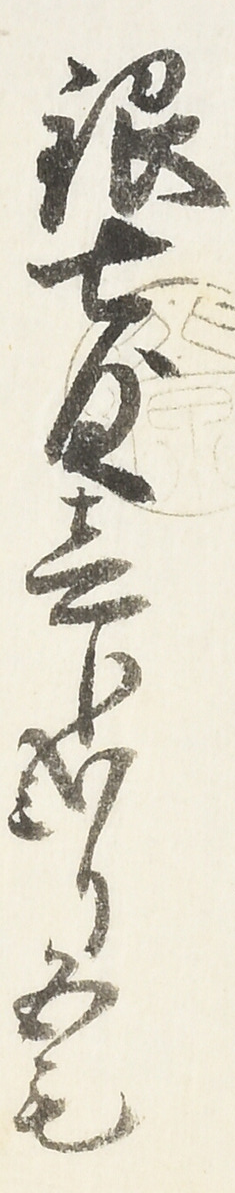銀七匁壱分弐厘五毛
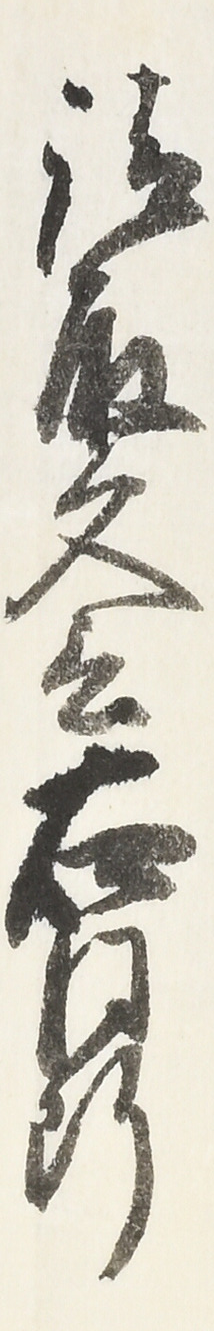請取文言右同断
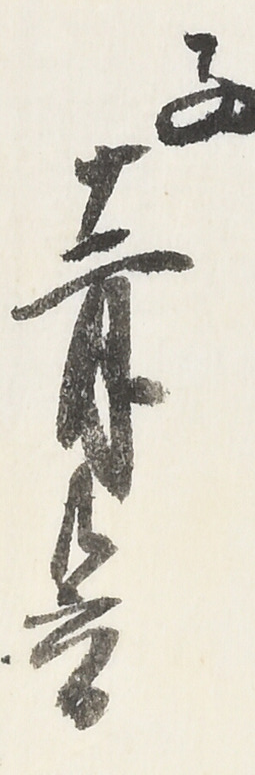十二月廿六日同断
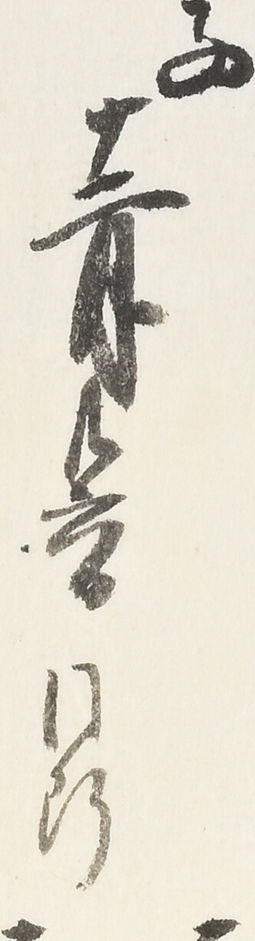十二月廿六日同断
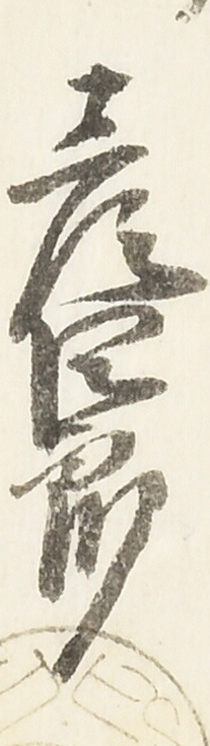彦四郎
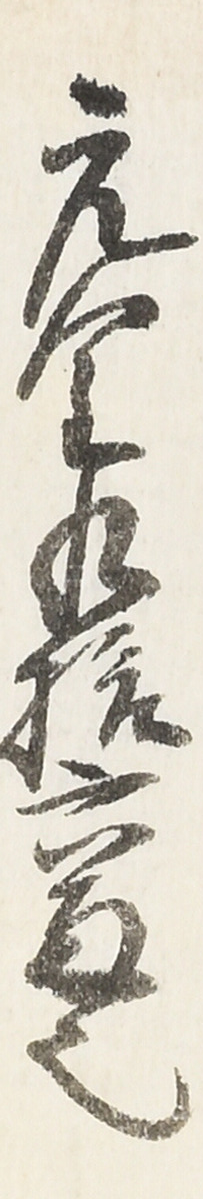元金九拾六両也
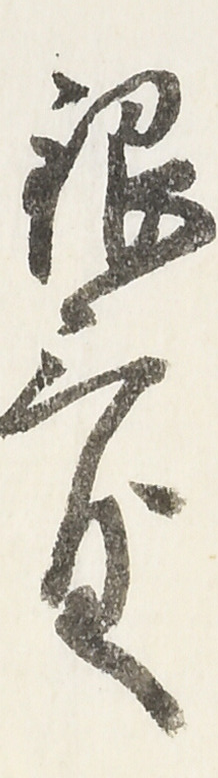銀三匁
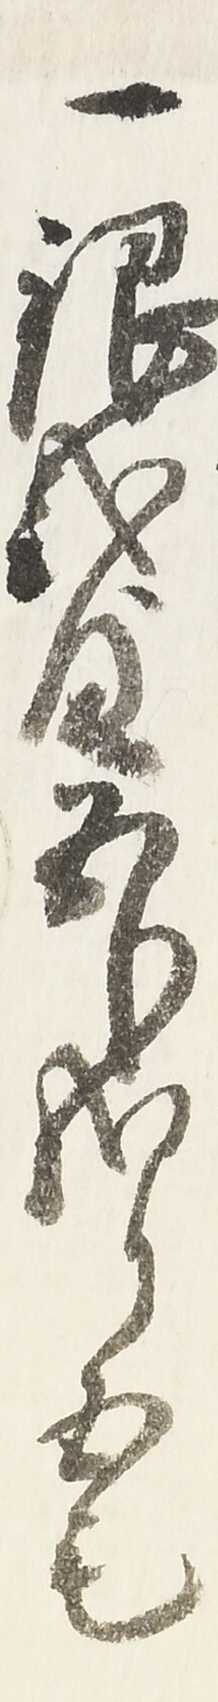一銀弐匁五分弐厘五毛
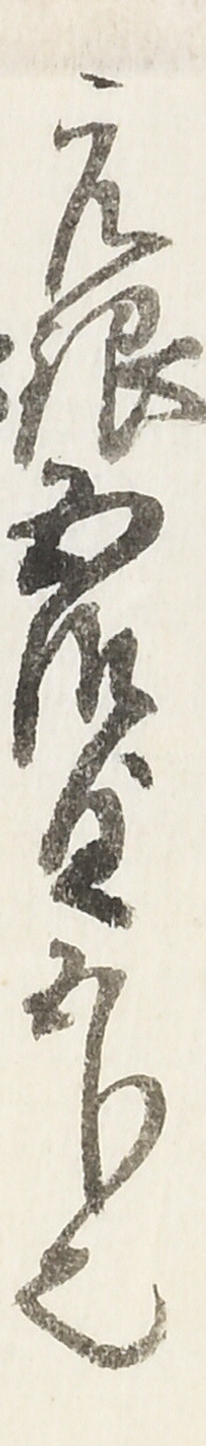元銀五拾匁五分也
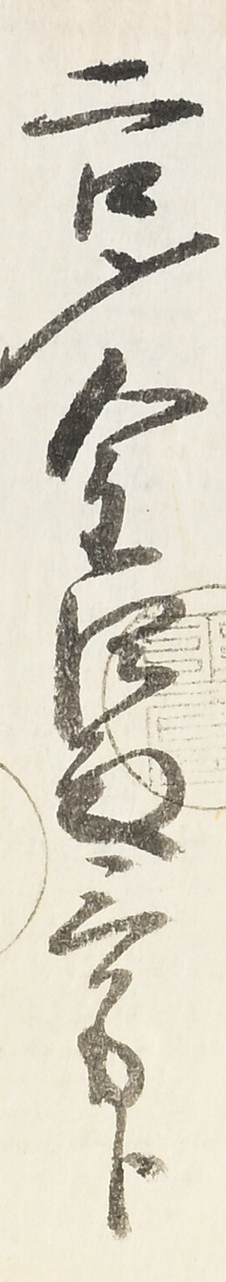二口〆金四両三分ト
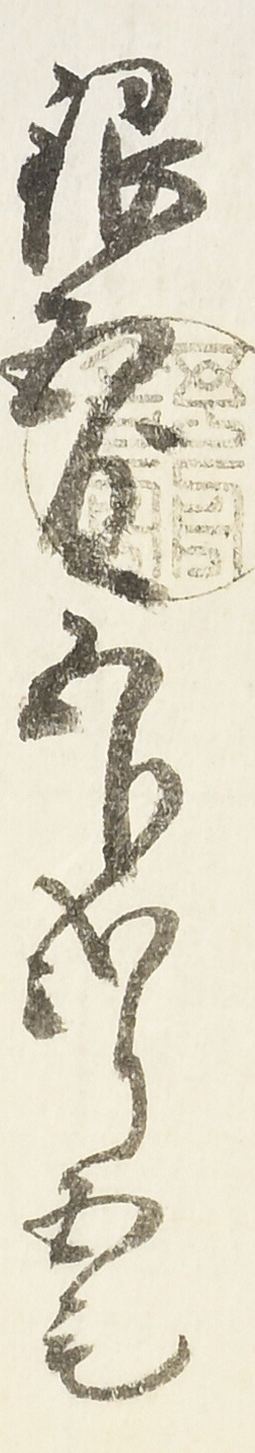銀五匁五分弐厘五毛
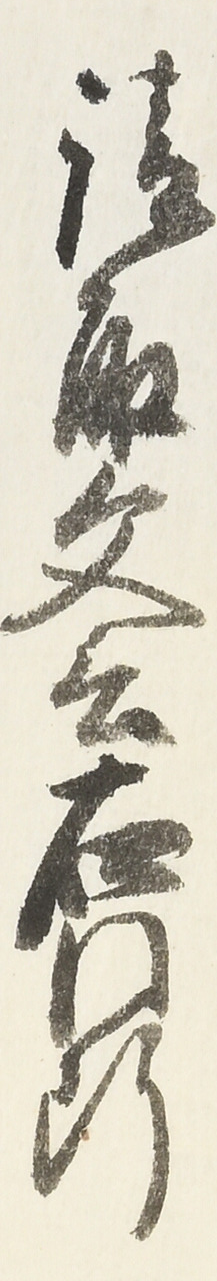請取文言右同断
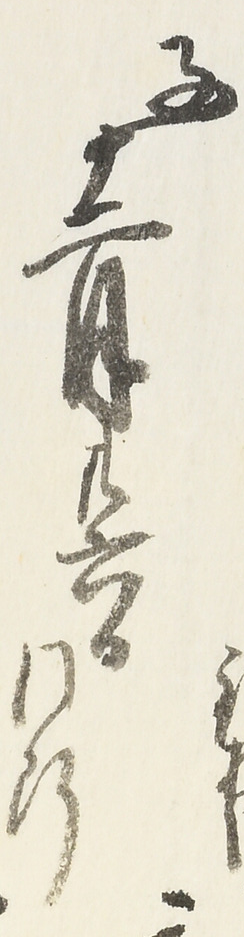十二月廿六日同断
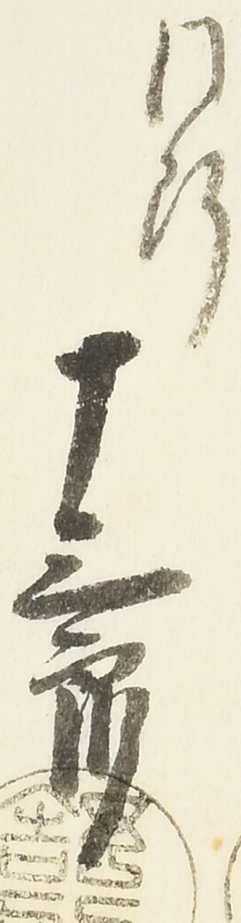十三郎
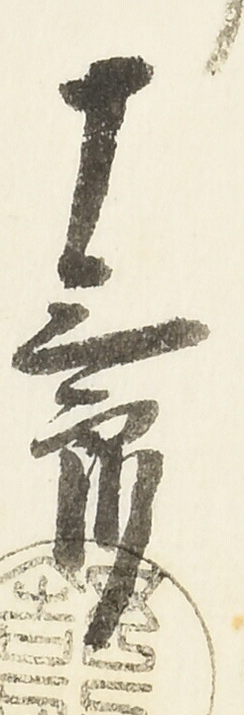十三郎
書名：御才覚金御利足割渡扣帳
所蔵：伊那市立高遠町図書館・合同会社AMANE
